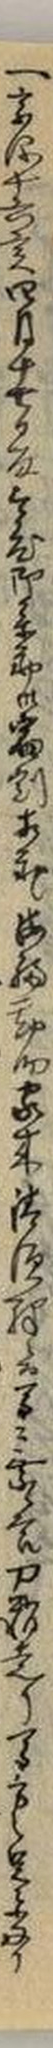一享保十六亥四月十七日留今度御参勤御宿割相勤候海福勘助家来清須駅ニ而馬ニ乗候節刀鞘走り馬方之足ニ当り
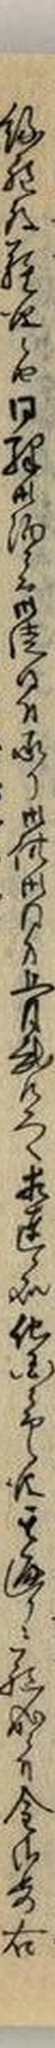余程致難儀候由同駅御泊ニ而御徒目付承り御供御目付上月武左衛門へ相達候処他国ニ而之儀其通りニ難成ニ付金弐歩右
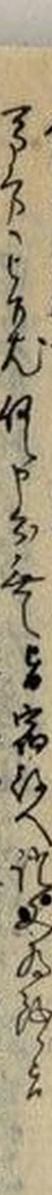馬方へ被下尤何之申分無之旨宿役人証文為致候旨
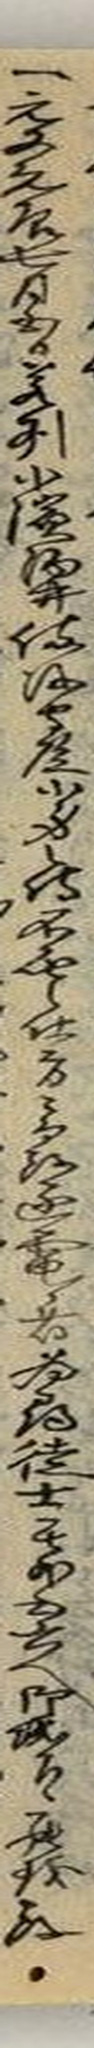一元文元辰七月五日若州小浜酒井備後守殿小身之侍不届之仕方ニ而致逐電候者為尋徒士其外五六人御城下へ罷越致
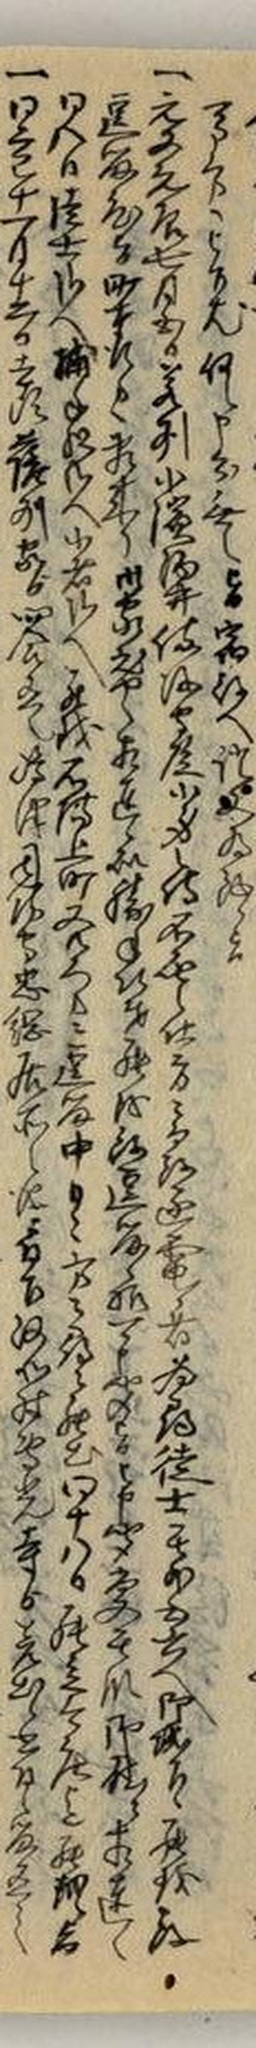逗留度旨町奉行方へ頼来り御家老中へ相達候処勝手次第罷越致逗留候様可申聞旨被申聞尚又其段御聴ニ相達候
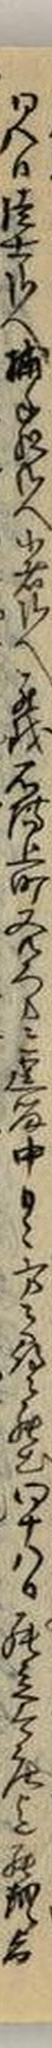同八日徒士弐人捕手組弐人小者弐人罷越石場上町又左衛門方ニ逗留中日々方々尋ニ罷出同十八日罷立今庄迄罷越候旨
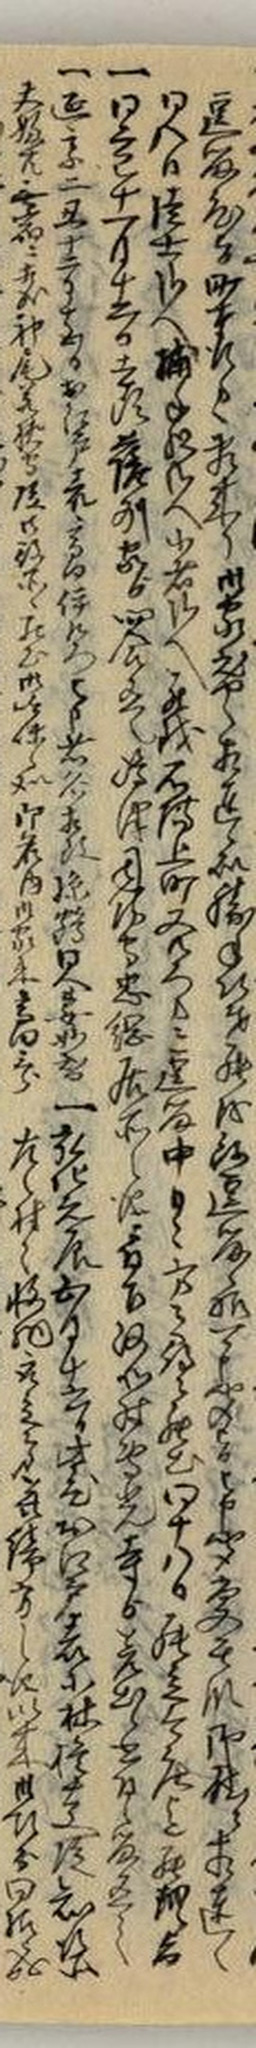一同二巳十一月十二日去頃薩州家ゟ問合有之嶋津周防守忠綱居所之儀ニ付下河北村専光寺ゟ差出候書付候留有之
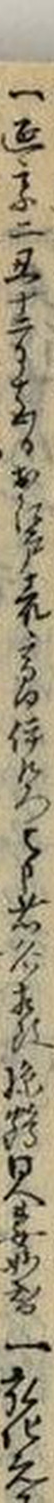一延享二丑十二月十五日於江戸表高田伊左衛門与申者名相改孫鶴同人妻妙智
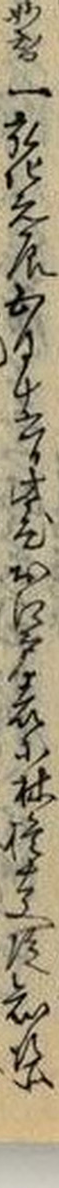一弘化元辰五月十六日此度於江戸表小林権太夫殿知行所
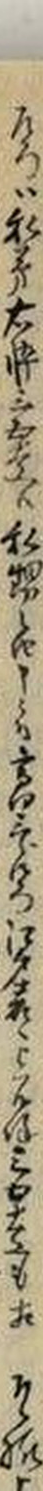左衛門ハ私弟右忰三五太夫ハ私甥之由申ニ付高田三郎左衛門江戸表へ被召呼三五太夫も相
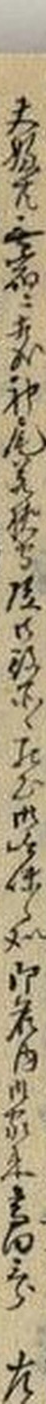夫婦共無宿ニ相成神尾若狭守殿御役所へ罷出御吟味候処御名内御家来高田三郎
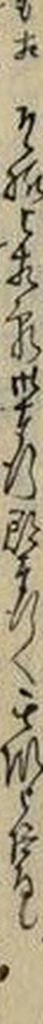下候様被相願御奉行郡奉行へ其段被仰付候
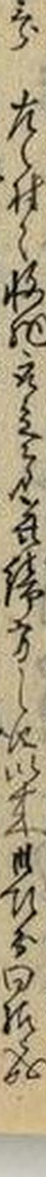左之村之収納取立方幷締方之儀以来御領分同様被成
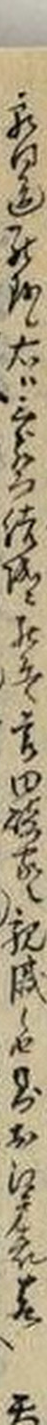願同道罷越候右ハ三郎左衛門結城ニ罷在候節田崎家之親戚之由則於江戸表若
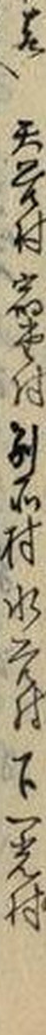天谷村宿堂村別所村水谷村下一光村
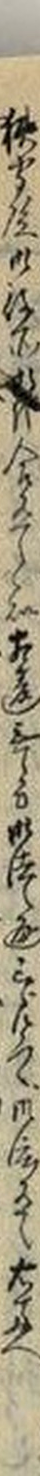狭守殿御役所合有之候処相違無之ニ付御法之通三郎左衛門へ御渡有之右両人
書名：御国他国諸事之部
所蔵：福井県文書館 Fukui Prefectural Archives
